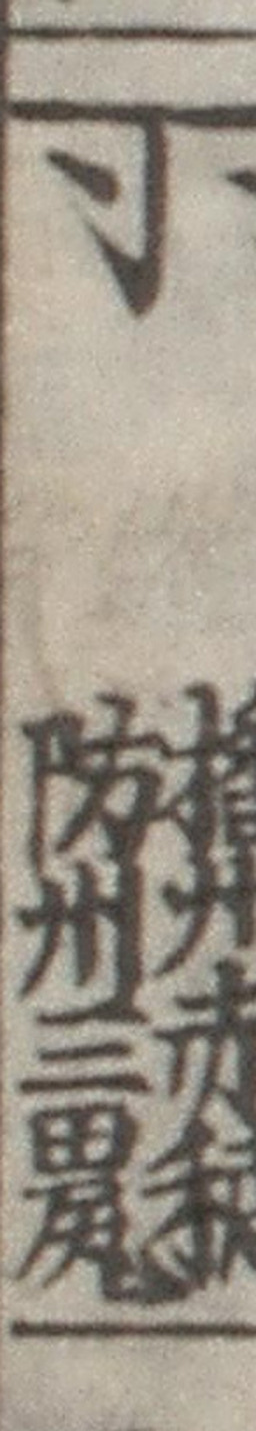同防州三田尻

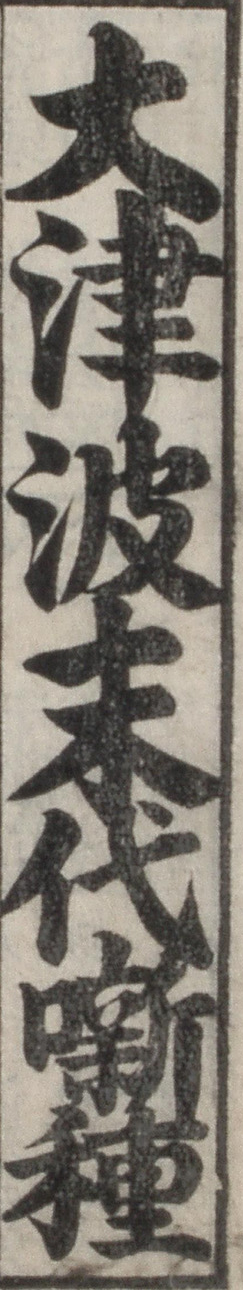大津波末代噺種
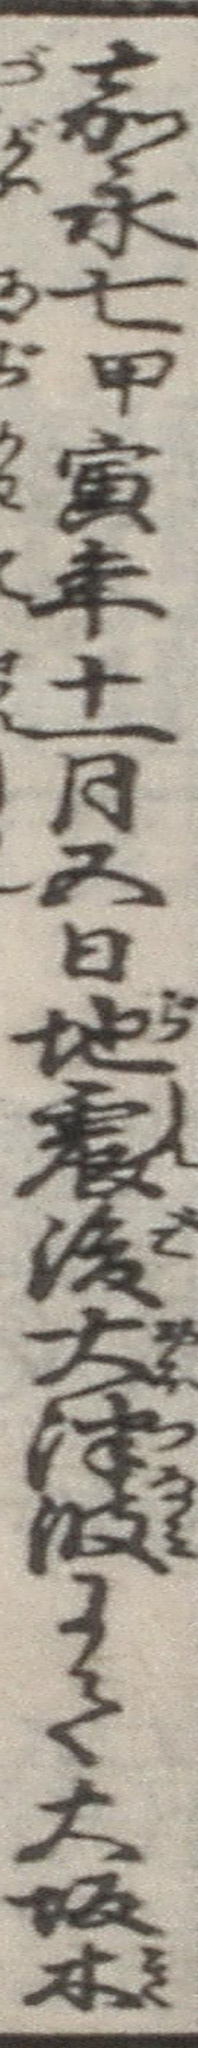嘉永七甲寅年十一月五日地震後大津波にて大坂木
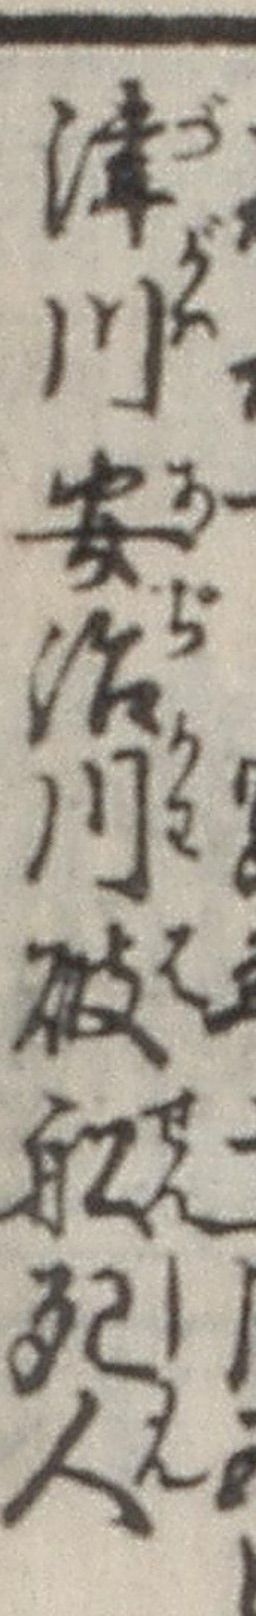津川安治川破舩死人
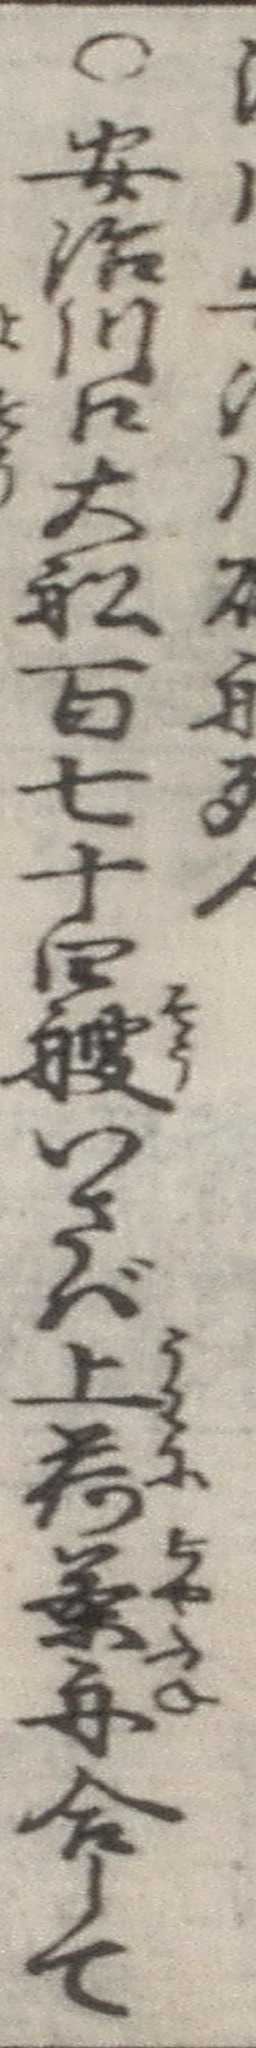○安治川口大舩百七十四艘いさば上荷茶舟合して
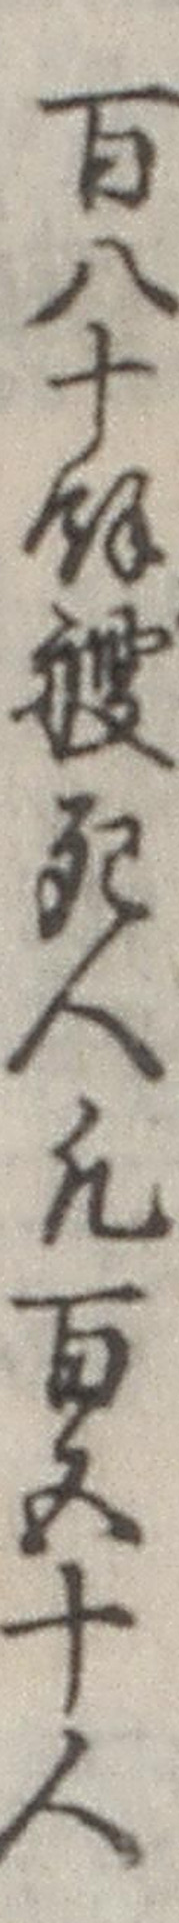百八十餘艘死人凡百五十人
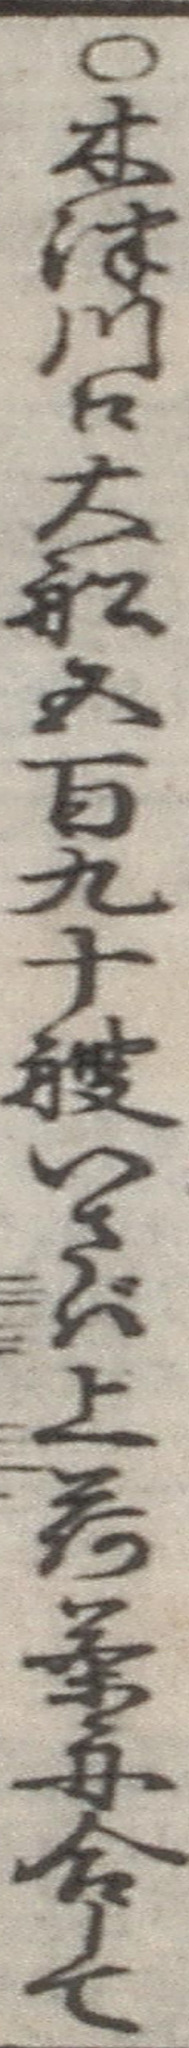○木津川口大舩五百九十艘いさば上荷茶舟合して
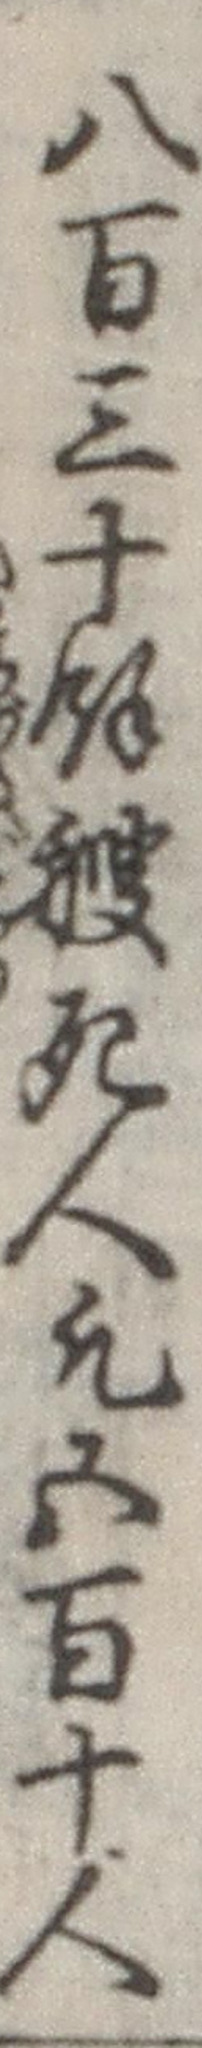八百三十餘艘死人凡五百十人
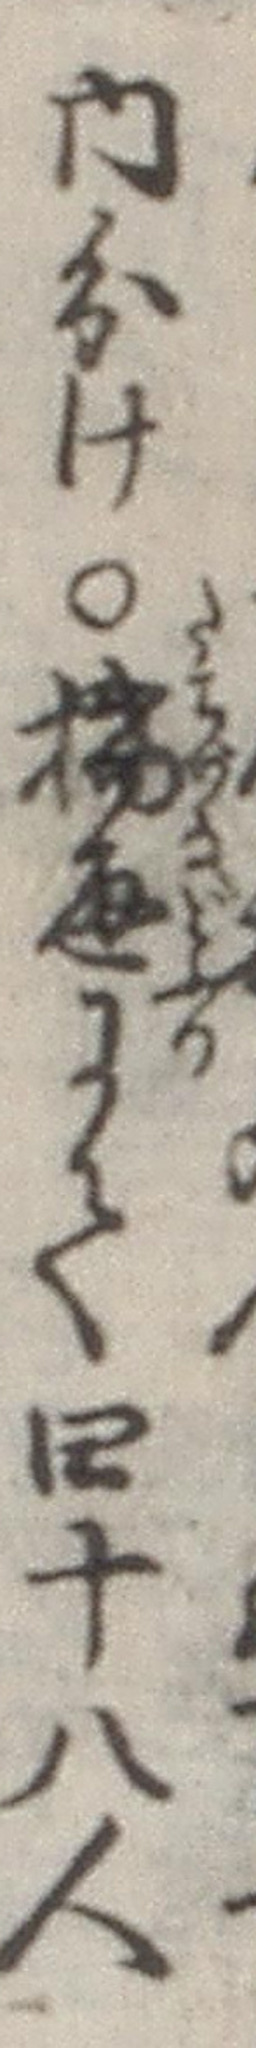門分け○橘通にて四十八人
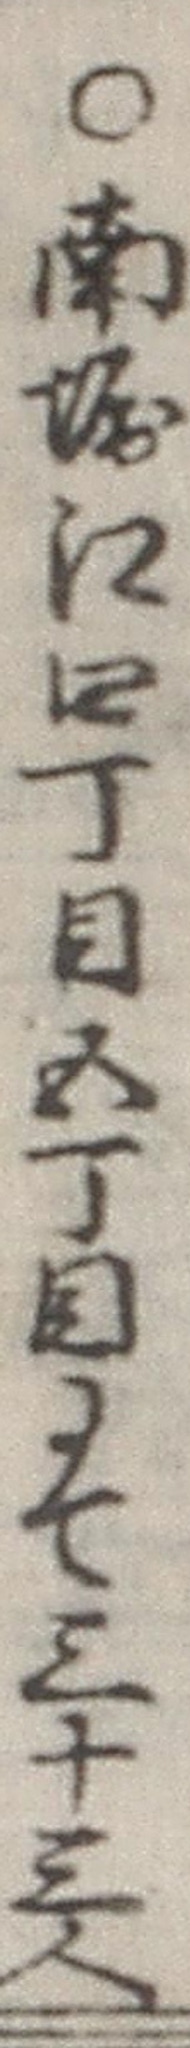○南堀江四丁目五丁目にて三十三人
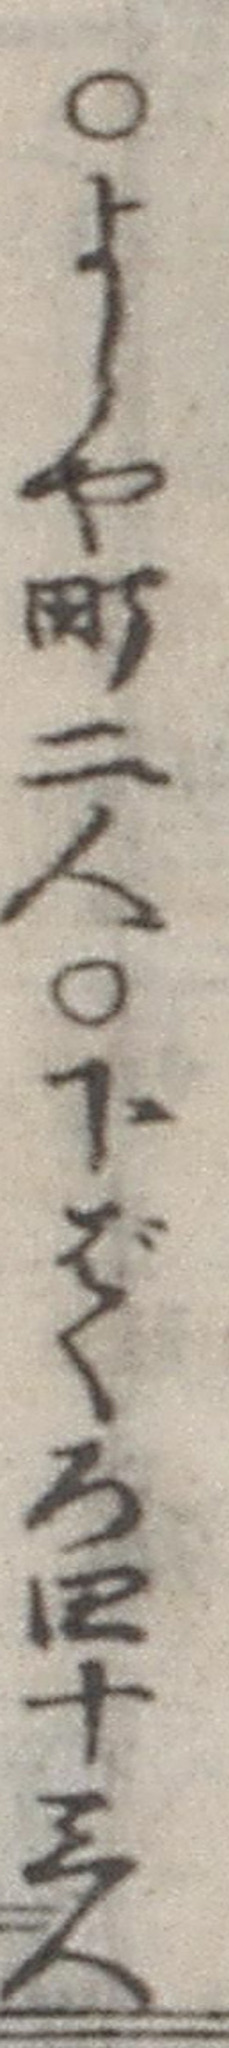○よしや町二人○下ばくろ四十三人
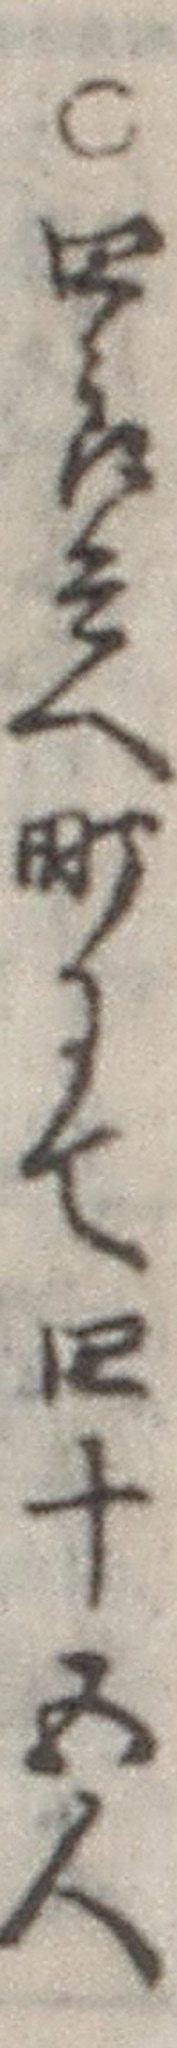○四郎兵衛町にて四十五人
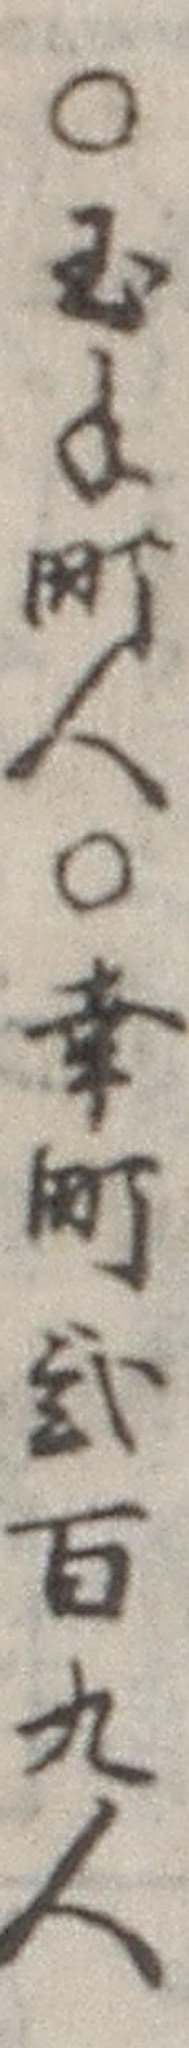○玉手町人○幸町弐百九人
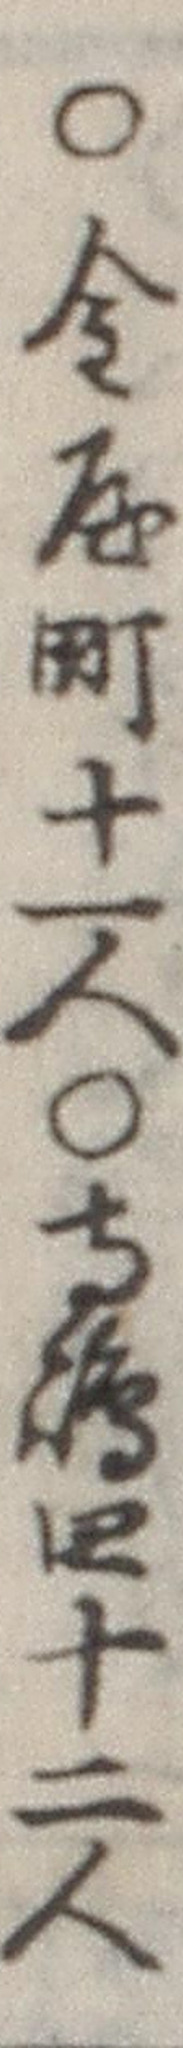○金屋町十一人○寺嶋四十二人
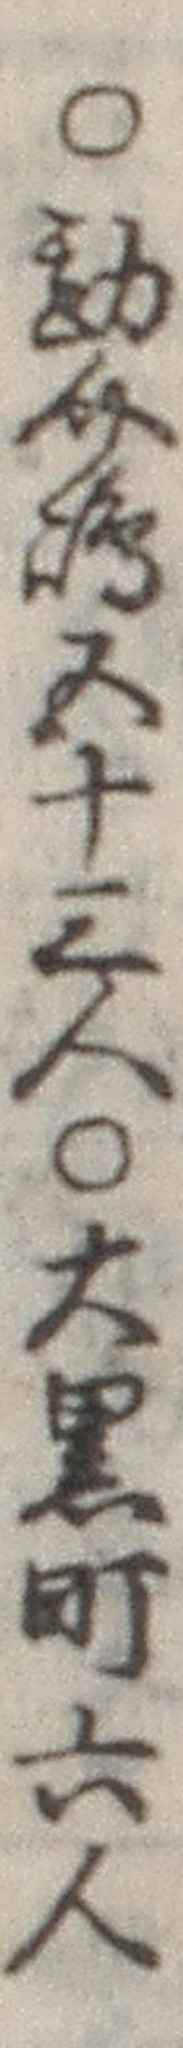○勘介嶋五十三人○大黒町六人
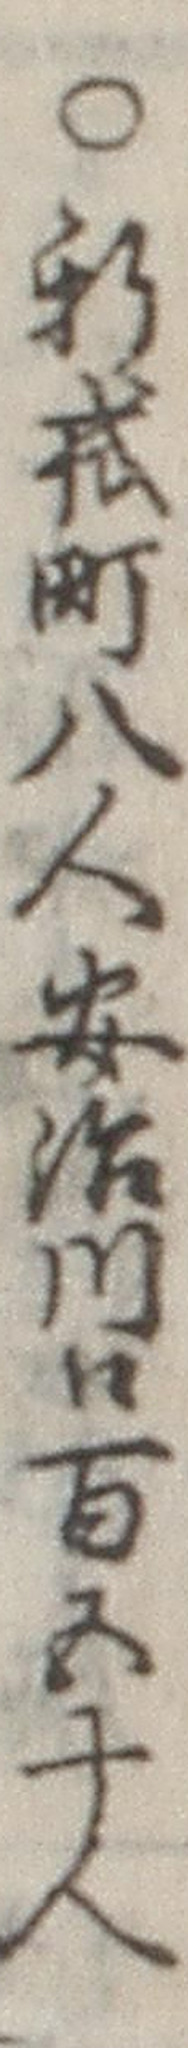○新戎町八人安治川口百五十人
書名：諸國大地震年代記　末代噺種
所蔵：東京大学地震研究所図書室 Earthquake Research Institute Library, The University of Tokyo, JAPAN
